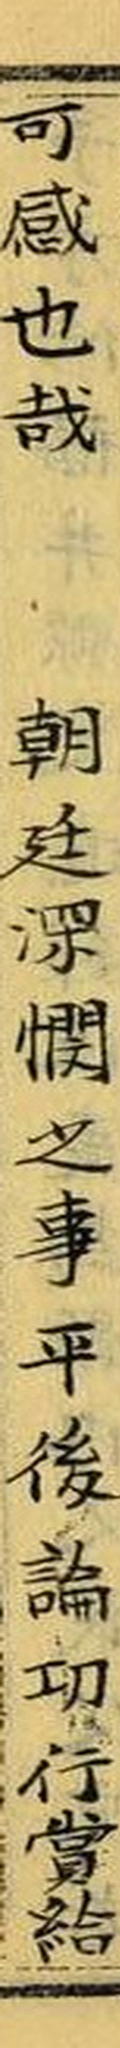可感也哉朝廷深憫之事平後論功行賞給
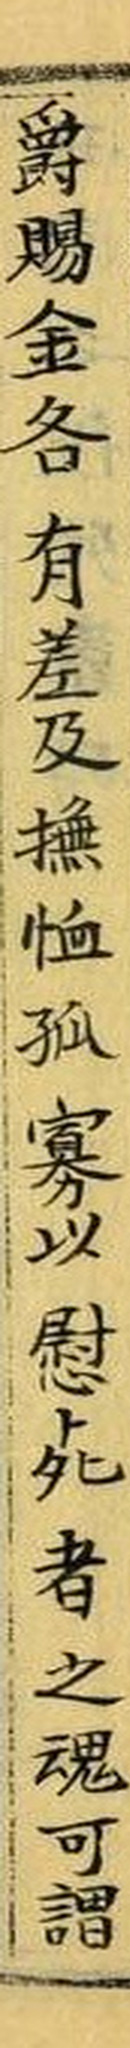爵賜金各有差及撫恤孤寡以慰死者之魂可謂
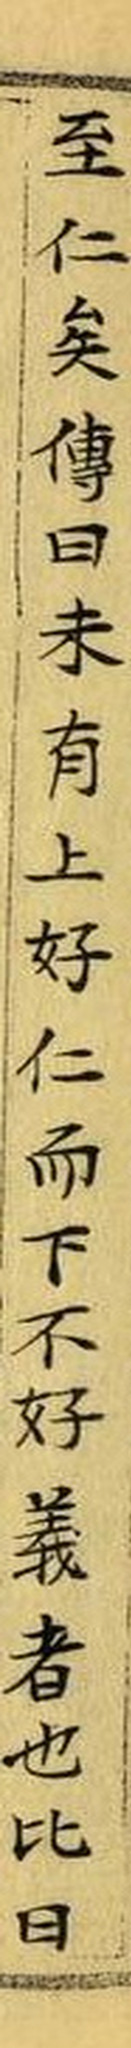至仁矣傳曰未有上好仁而下不好義者也比日
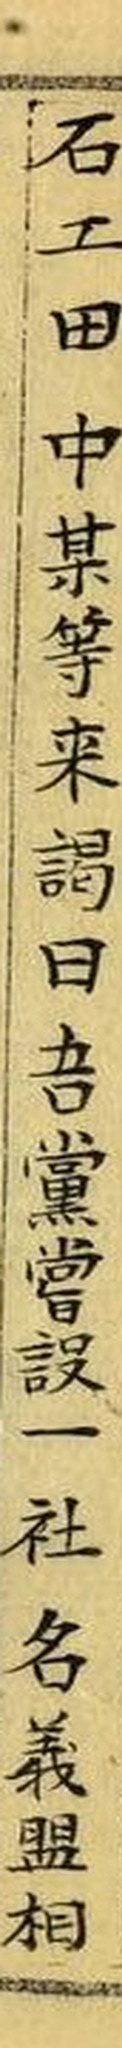石工田中某等来謁曰吾黨嘗設一社名義盟相
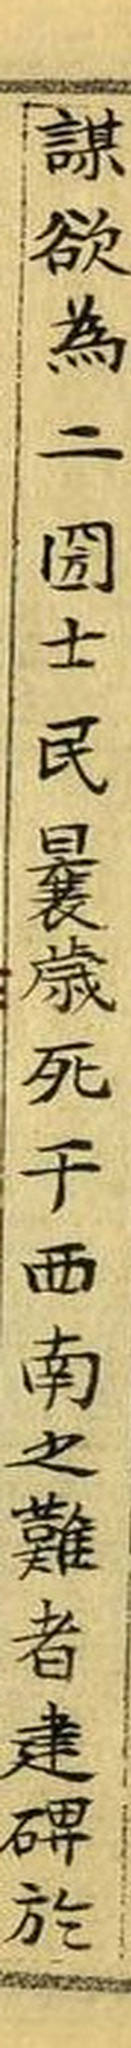謀欲為ニ圀士民曩歳死于西南之難者建碑於
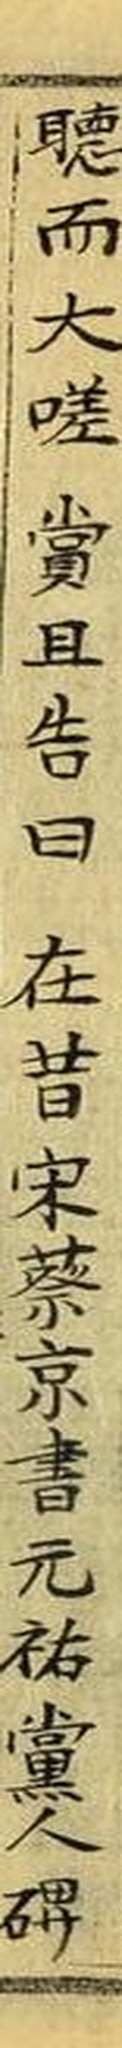聽而大嗟賞且告曰在昔宋蔡京書元祐黨人碑
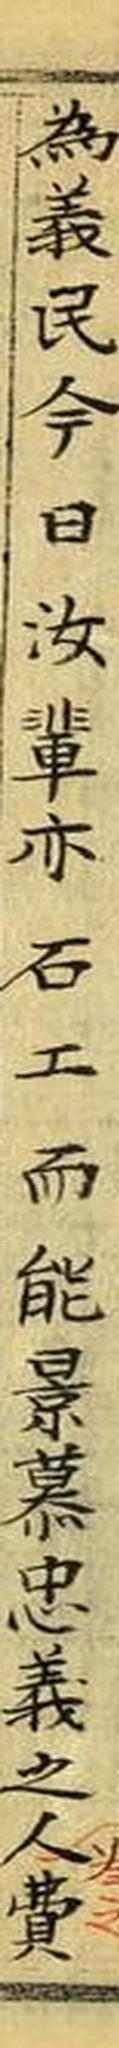為義民今日汝輩亦石工而能景慕忠義之人費
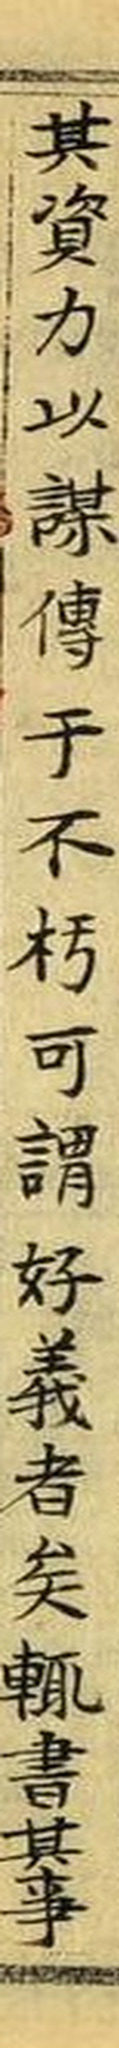其資力以謀傳于不朽可謂好義者矣輒書其事
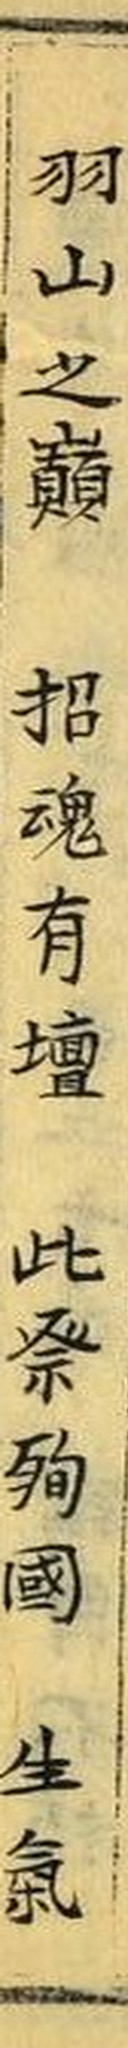羽山之巓招魂有壇此祭殉國生氣

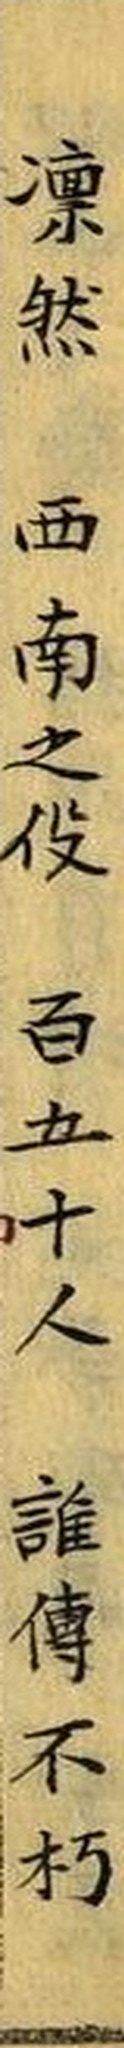凛然西南之役百五十人誰傳不朽
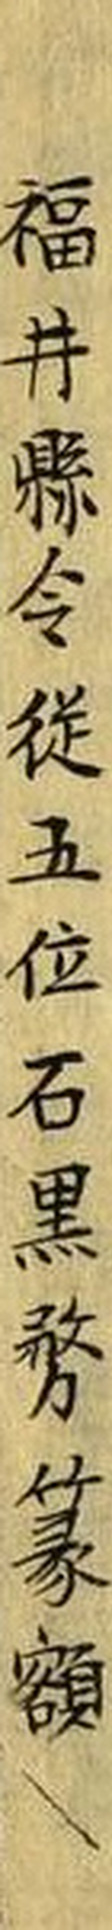福井縣令従五位石黒務篆額
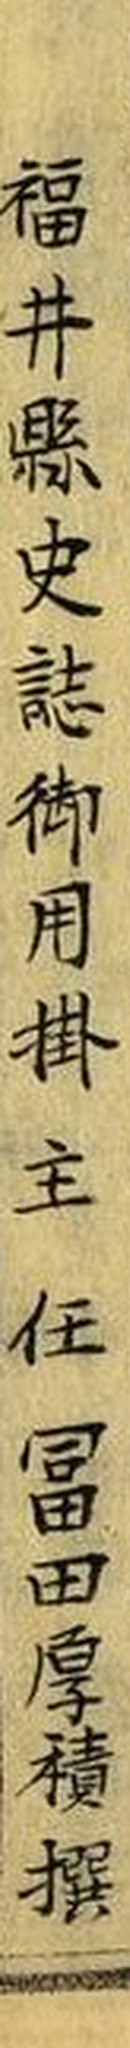福井縣史誌御用掛主任冨田厚積撰
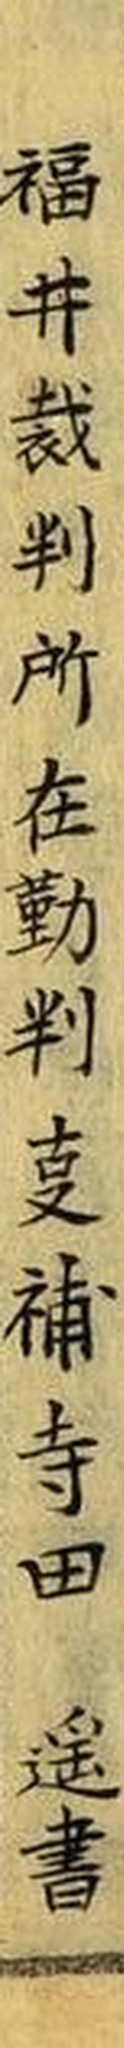福井裁判所在勤判叓補寺田遥書
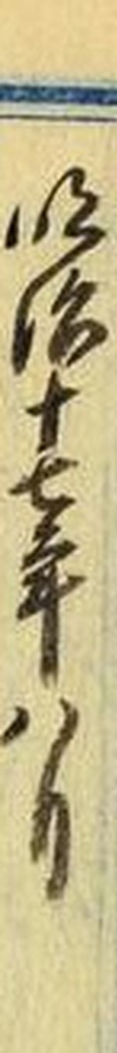明治十七年八月
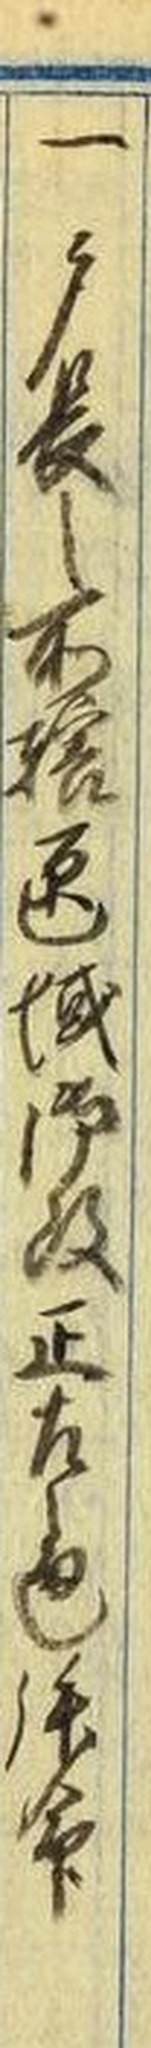一戸長之所轄区域御改正左之通拝命
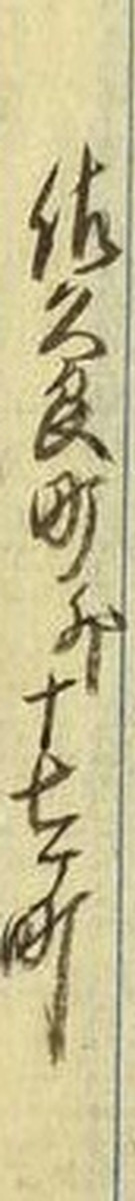佐久良町外十七ヶ町
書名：温古集 五巻
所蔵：福井県文書館 Fukui Prefectural Archives
